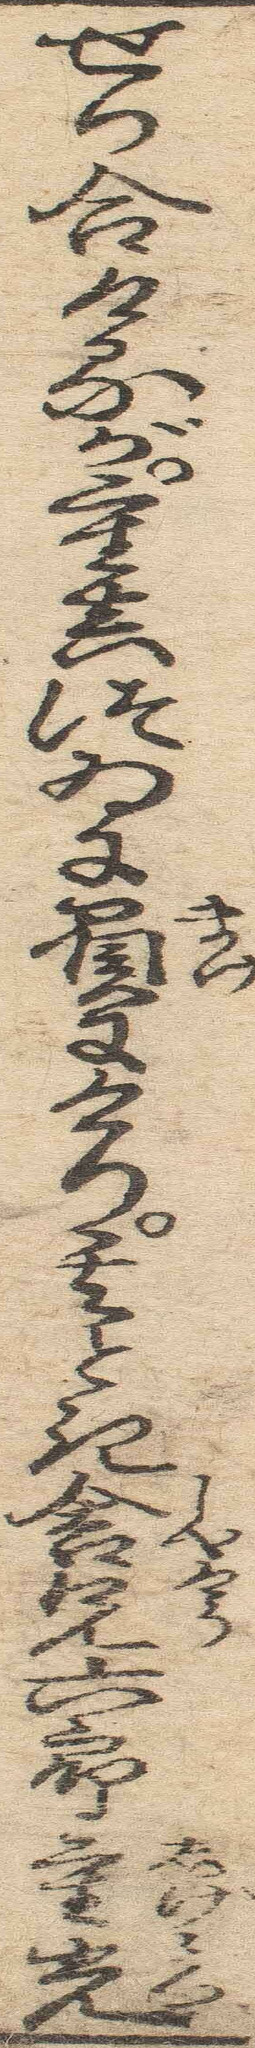せり合けるが。重真つゐに負にけり。其とき舎兄六郎重光
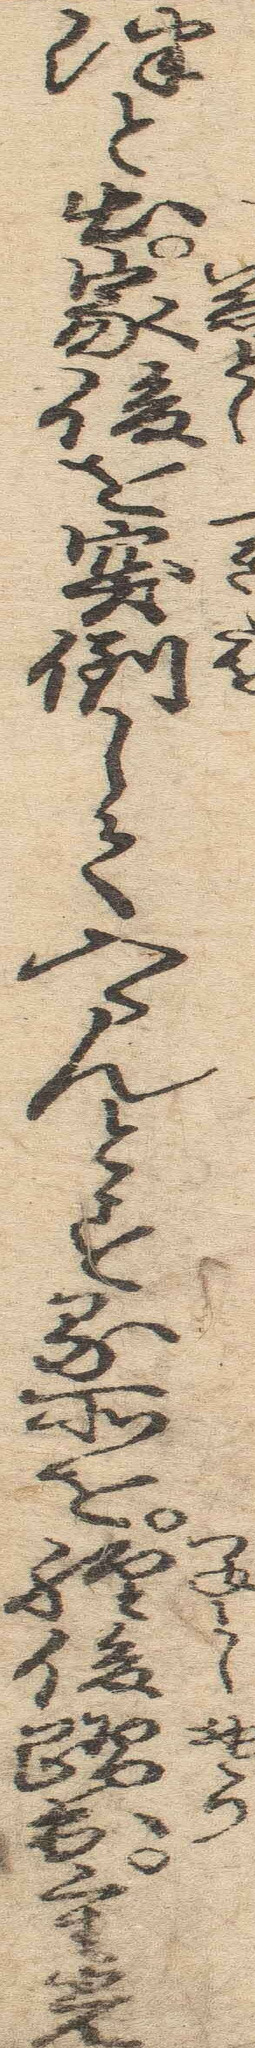つと出。家俊を突倒して入らんとする所を。経俊躍出。重光
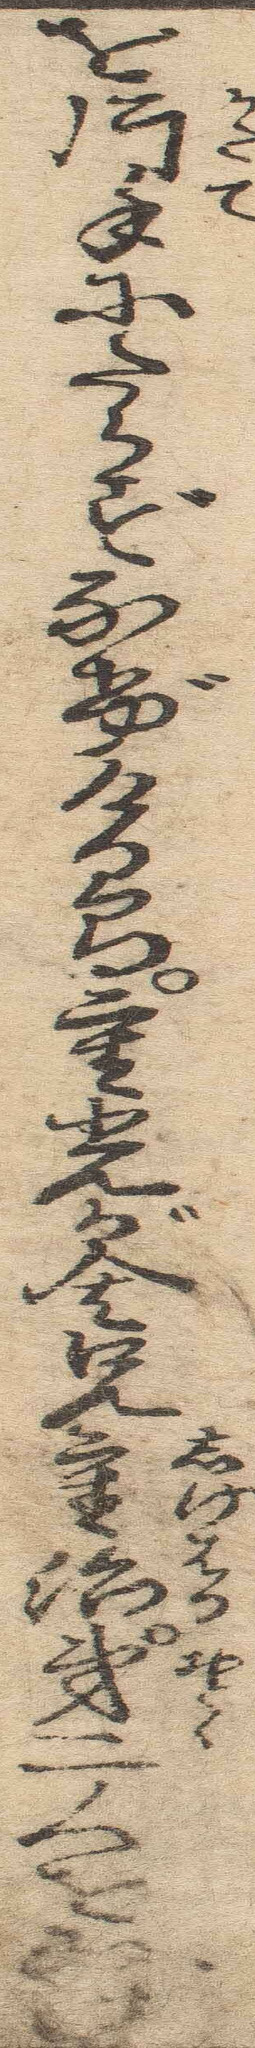を片手にたらずなげける間。重光が舎兄重治。弟二人をなげ
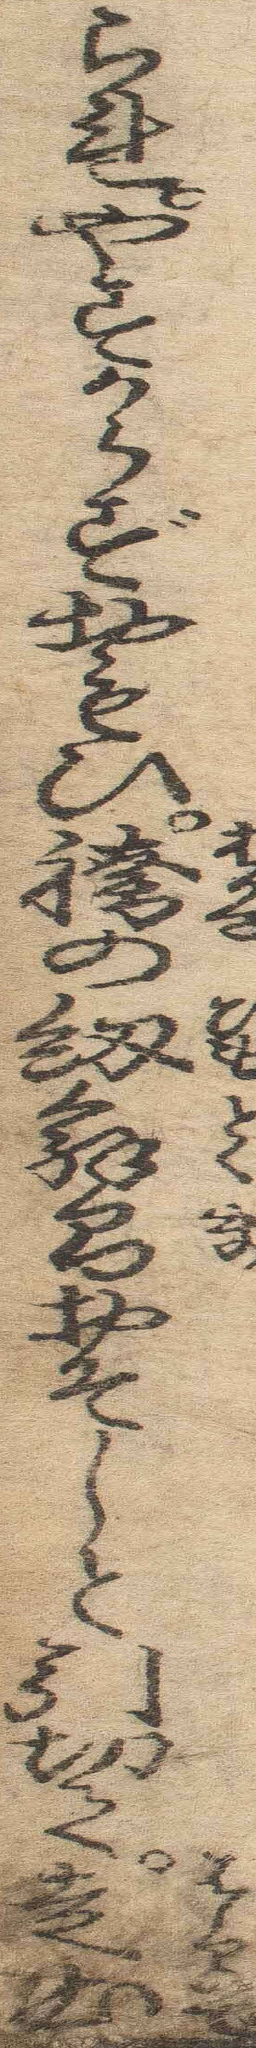られ。やすからずおもひ。袴の紐解間おそしと引切て。走出

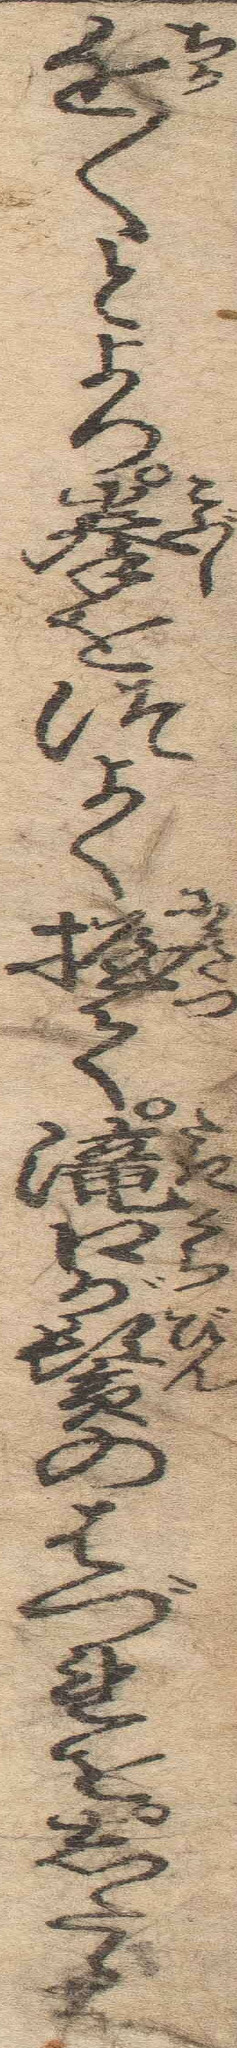近〳〵とより。拳をつよく握て。滝口が鬢のはづれを。したゝ
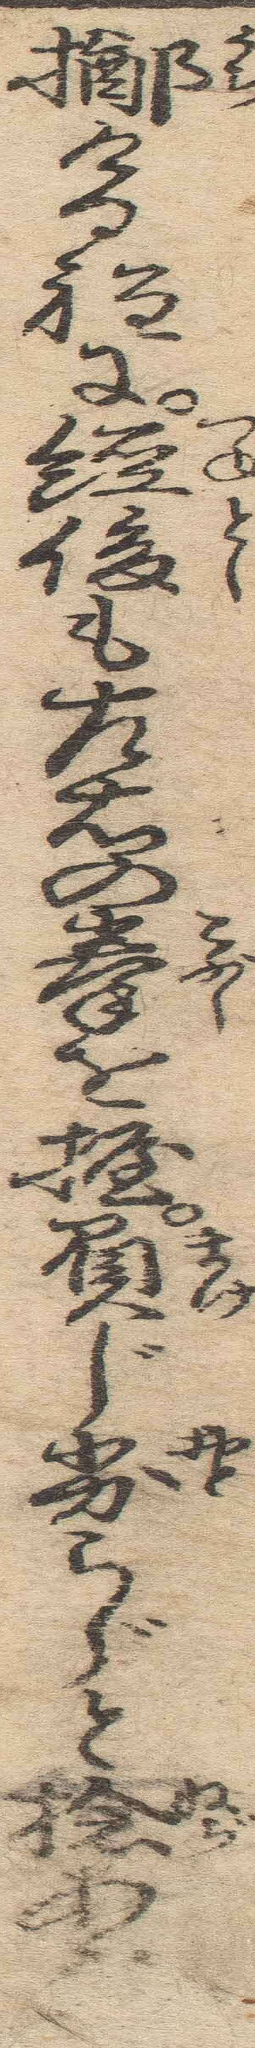擲ける程に。経俊も左右の拳を握。負じ劣らじと捻あ
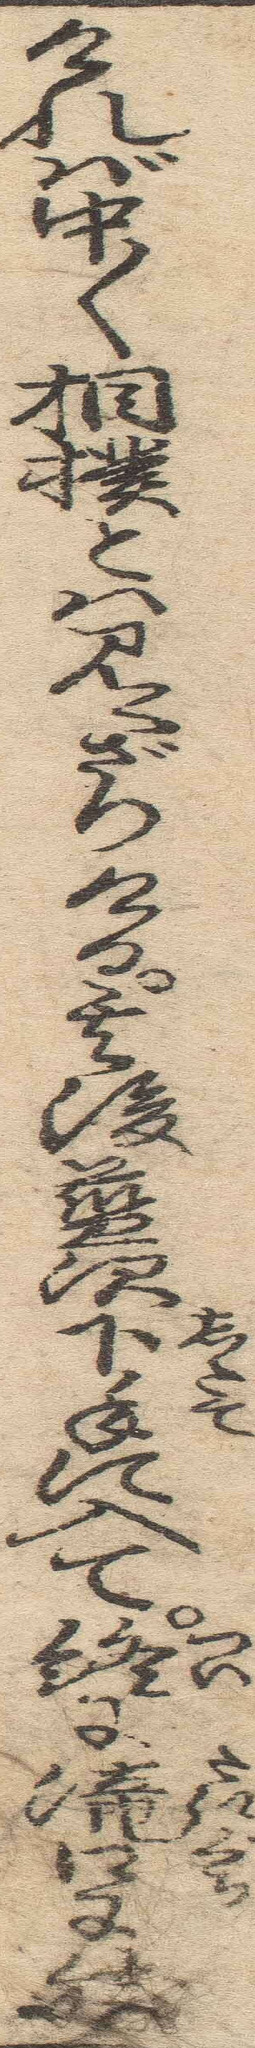ければ中〳〵相撲とは見へざりける。其後藍沢下手に入て。終に滝口に
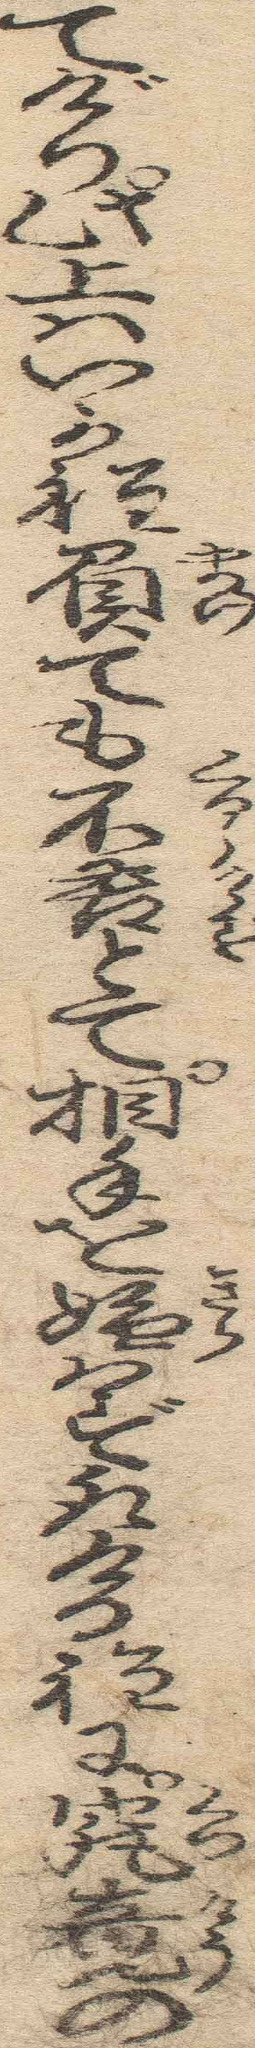てげり。此上はいか程負ても不苦とて。相手を嫌はず取ける程に。究竟の
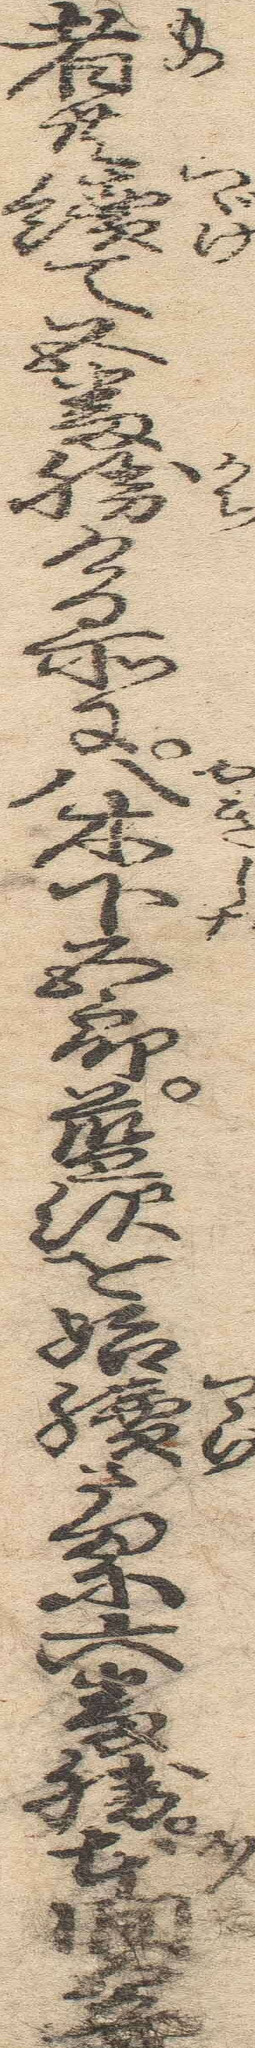者共続て五番勝ける所に。八木下五郎。藍沢を始続さまに六番勝。本間五郎
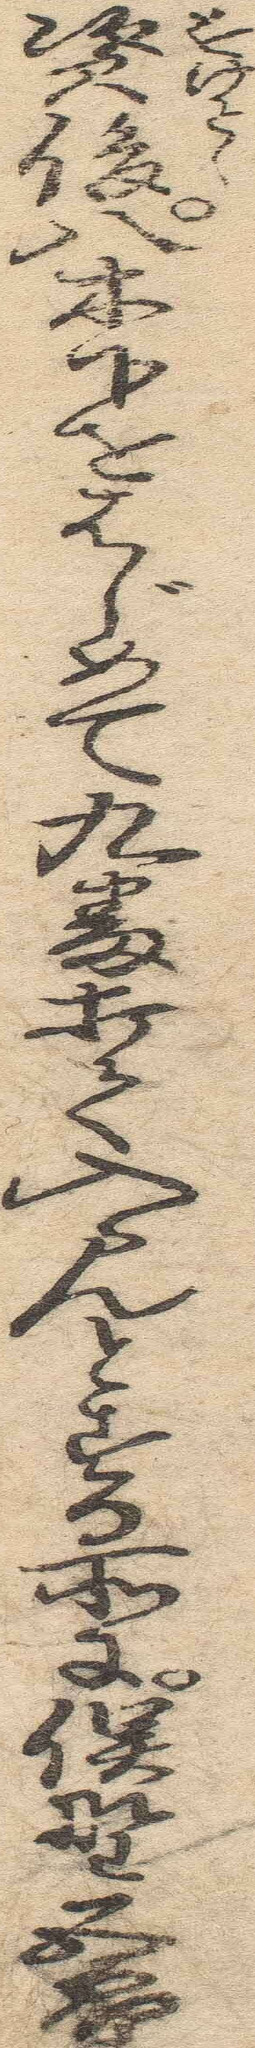資俊。八木下をはじめて九番打て入らんとする所に。俣野五郎
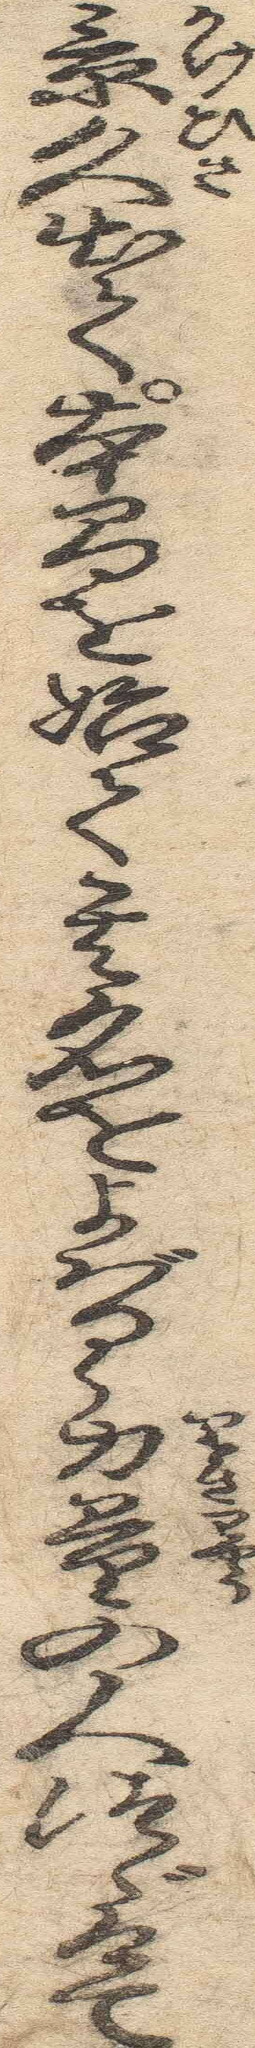景久出て。本間を始て其名をよばるゝ力量の人つゞけて
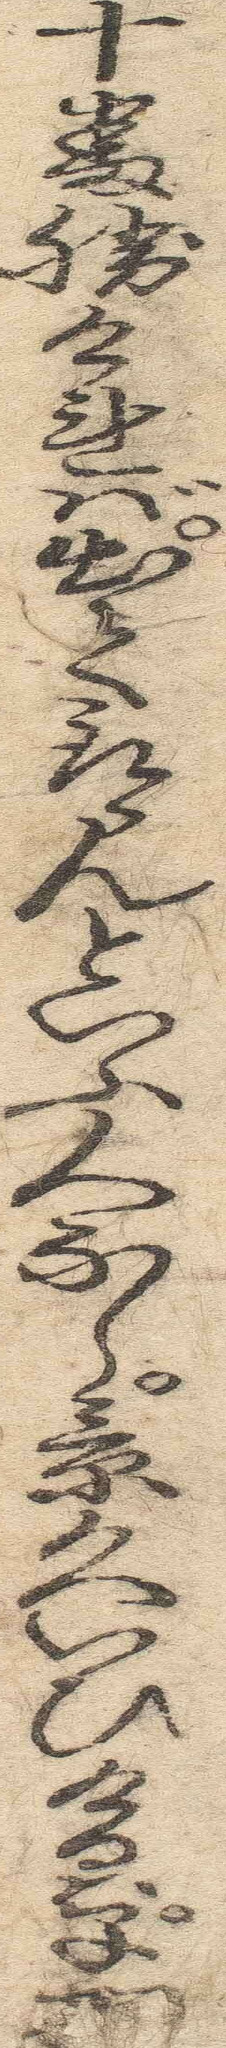十番勝ければ。出て取らんといふ人なし。景久いひけるはに。
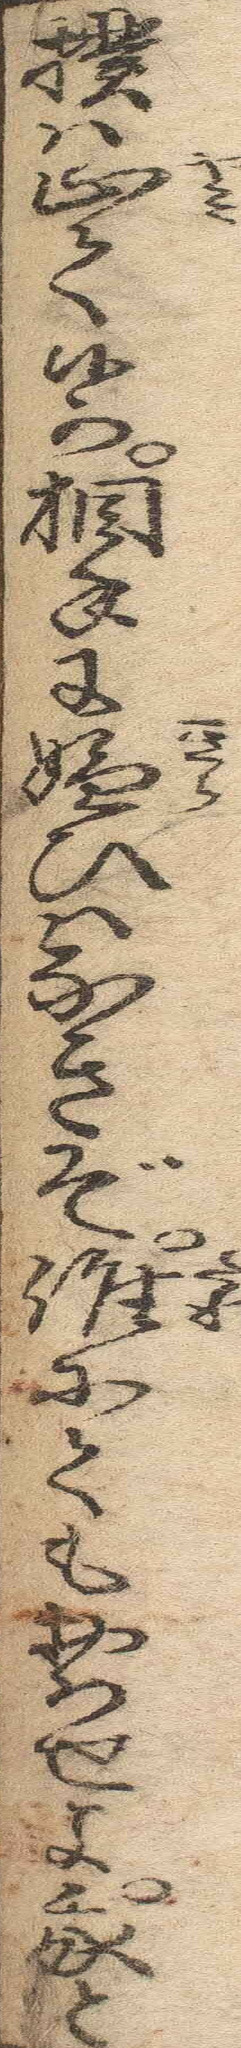撲は止て候か。相手に嫌ひはなきぞ。誰にてもおはせよ。我と
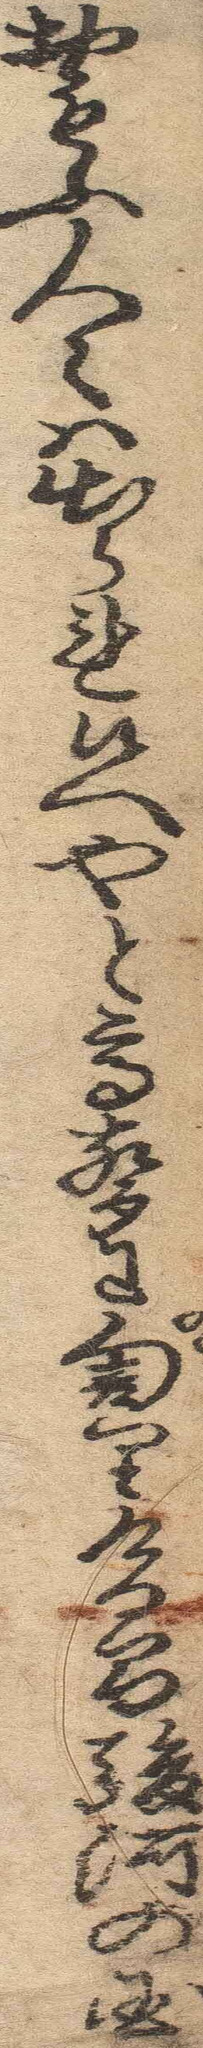おもふ人々は出られ候へやと髙声に罵りける間駿河の国
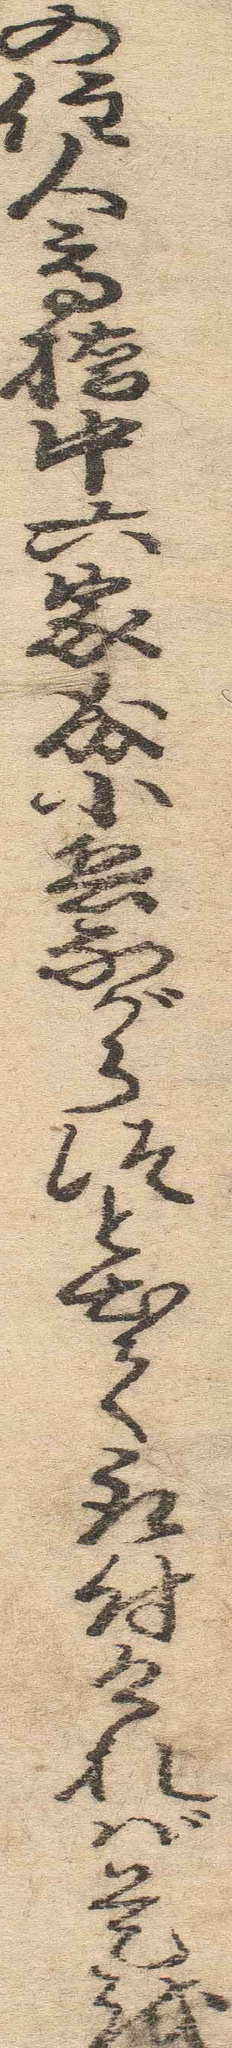の住人高橋中六家成小兵ながらつと出て取付ければ是を
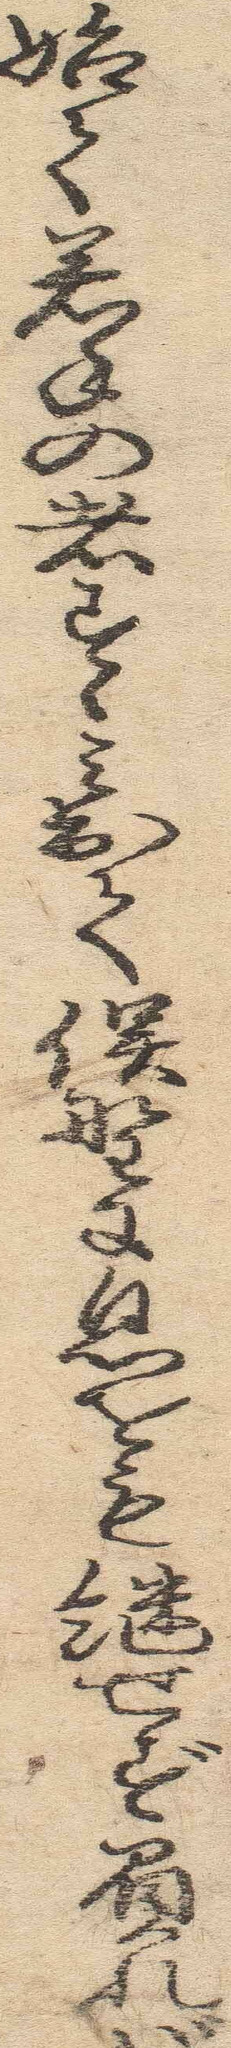始て若手の者すゝみ出て俣野に息をも継せず負れば
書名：古今相撲大全
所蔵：東京学芸大学附属図書館 国文学研究資料館
